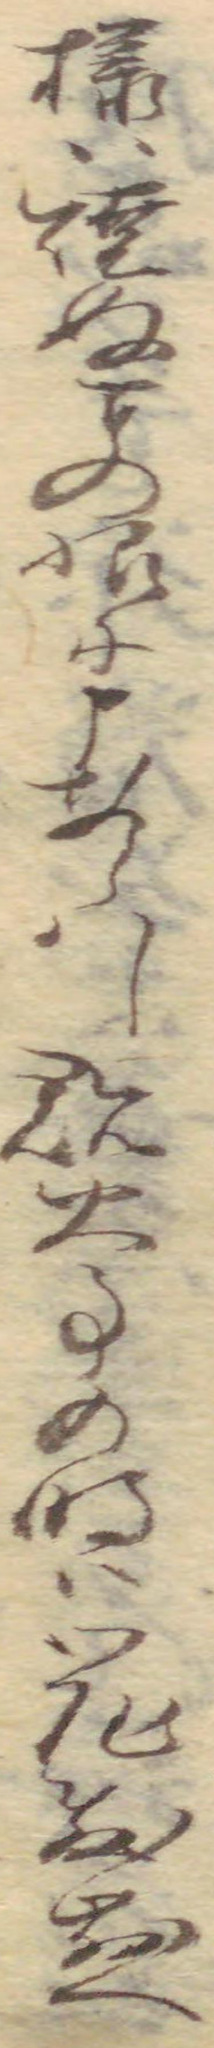様ハ焼ぬもの様に申ならハし既火事の時ハ御屋敷前へ
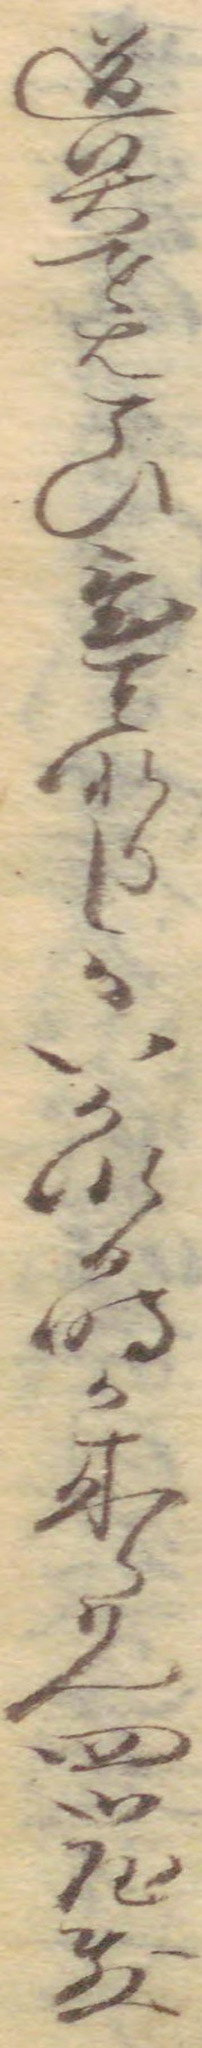道具をはこひ置すなりしにいかなる時か来りけん四御屋敷

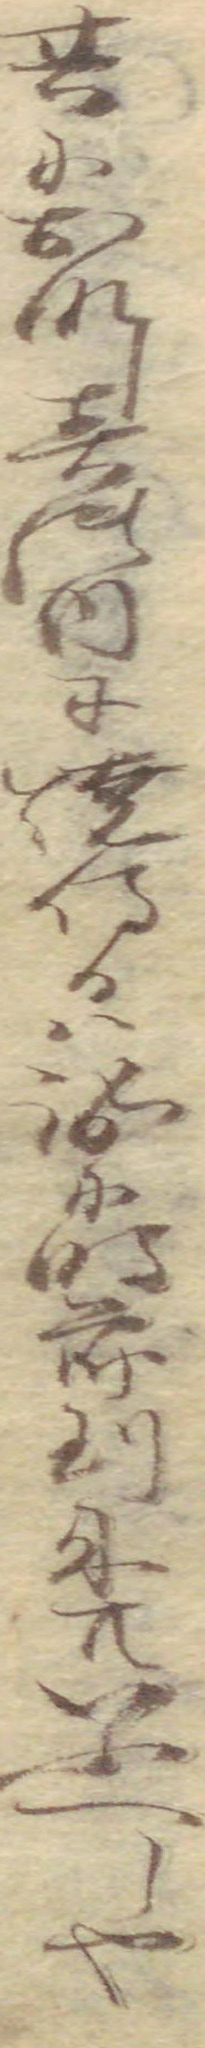共におなし春の内に焼侍るハ誠に時節到来共いふへしや
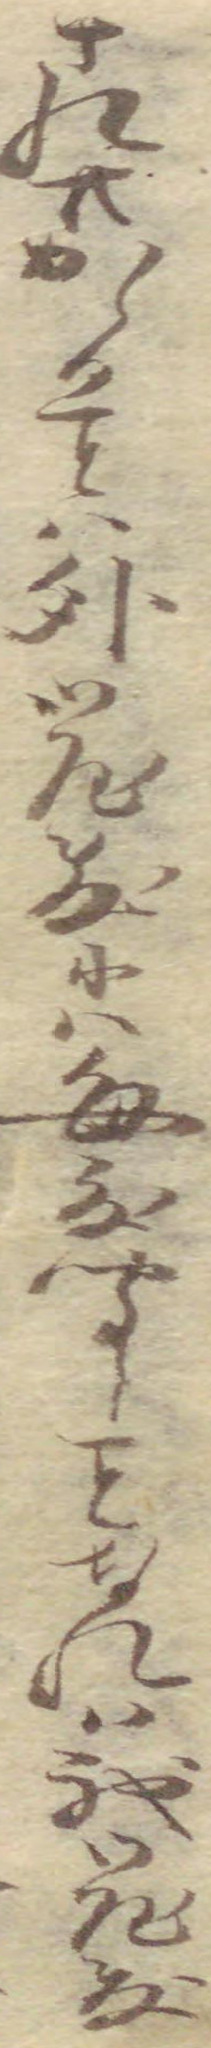され共かゝることハ外御屋敷にハ毎度聞しことなれハ我御屋敷
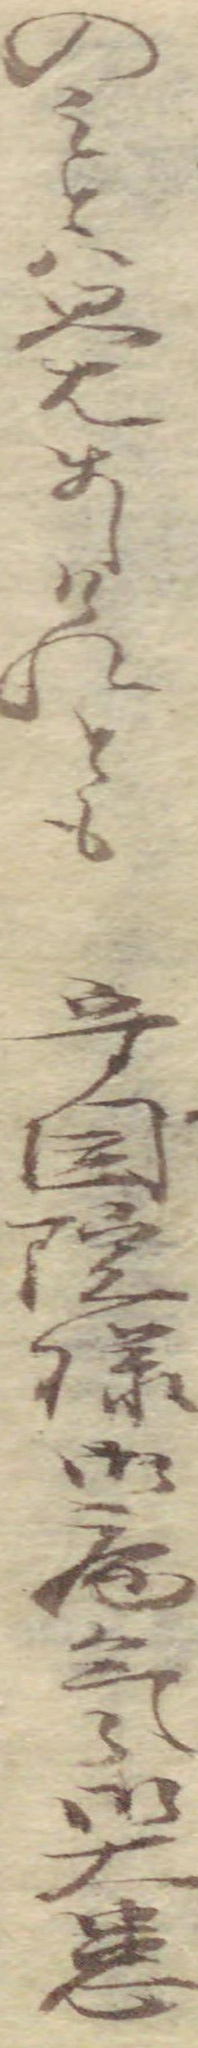のミとハ思はましけれとも守国院様御病気御大患
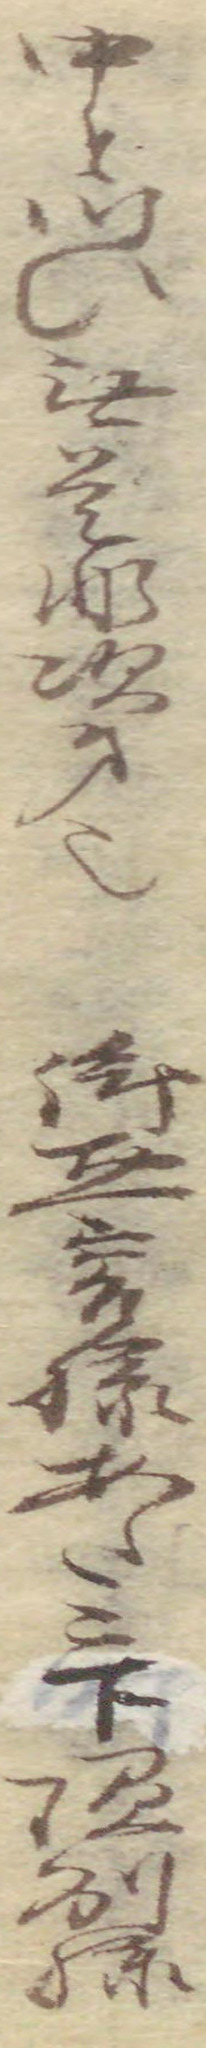中といひ無是非次第也御惣容様あたこ下隠州様
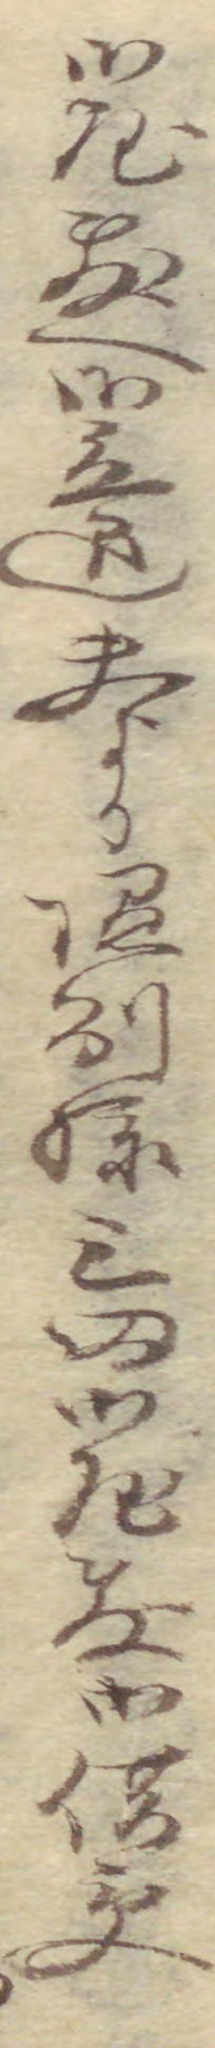御屋敷へ御立退夫より隠州様三田御屋敷御借受
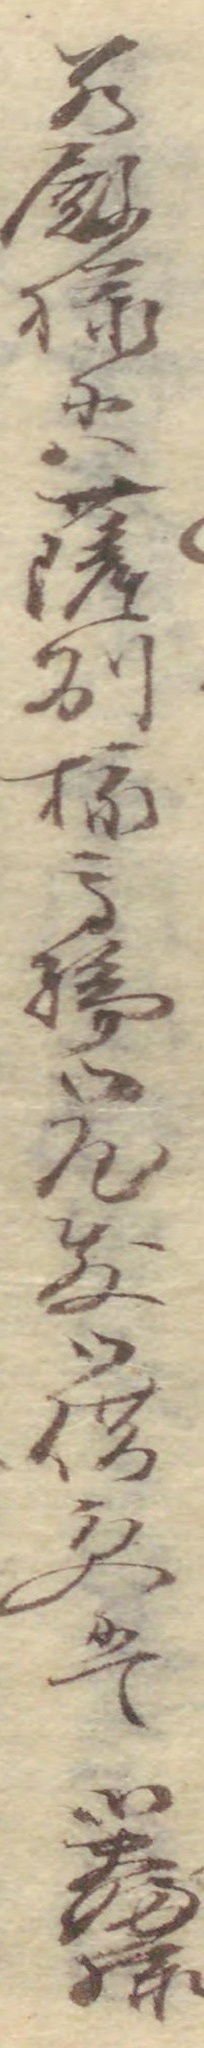若殿様にハ薩州様高輪御屋敷御借受にて御夫婦様
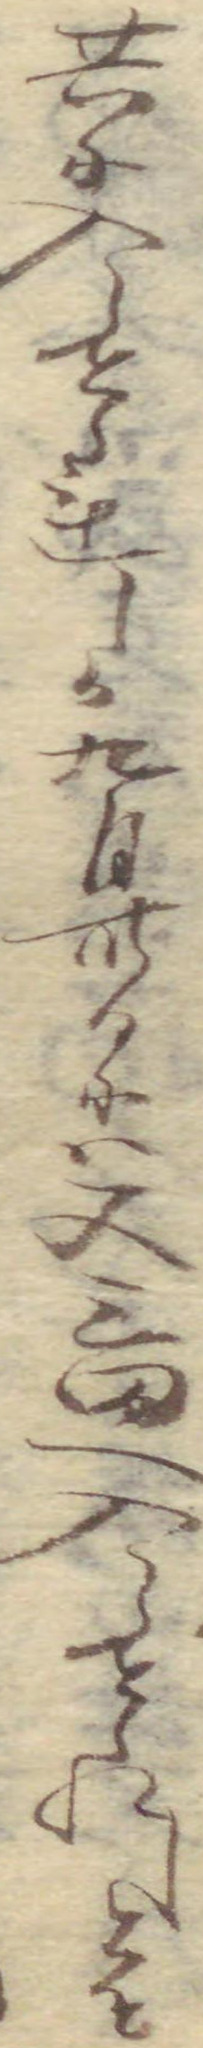共に入しをられしか九月丗日にハ又三田へ入しをられしとそ
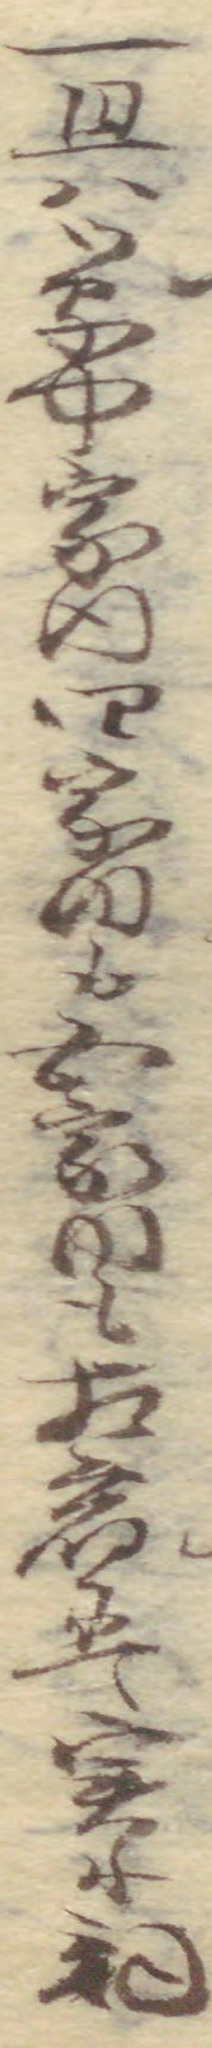一旦ハ御家中家内四家内も五家内も相宿にて実に詞
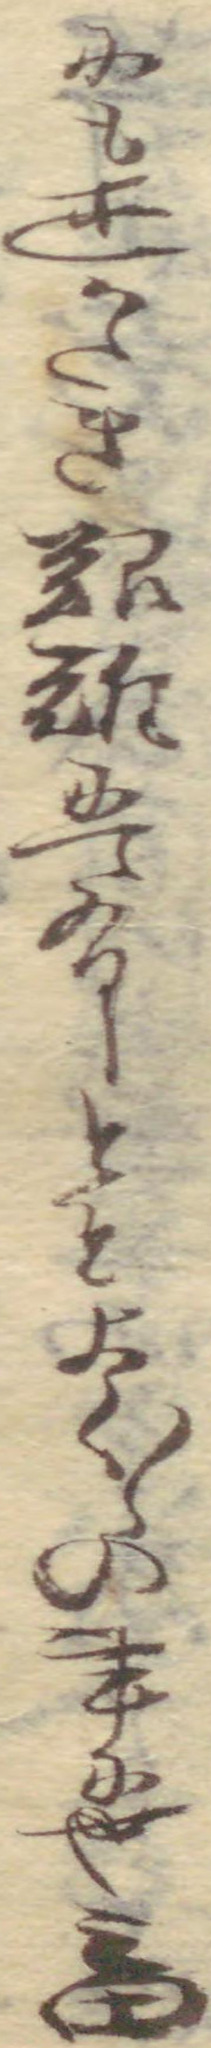にも述かたき艱難にて有之ともよく〳〵の事にや三田
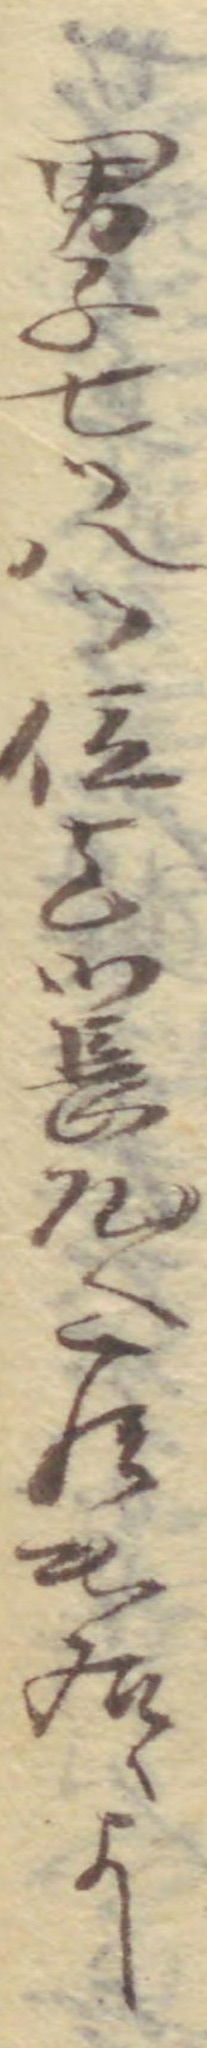男子七ツ八ツ位迄御長屋へ罷出居候よし
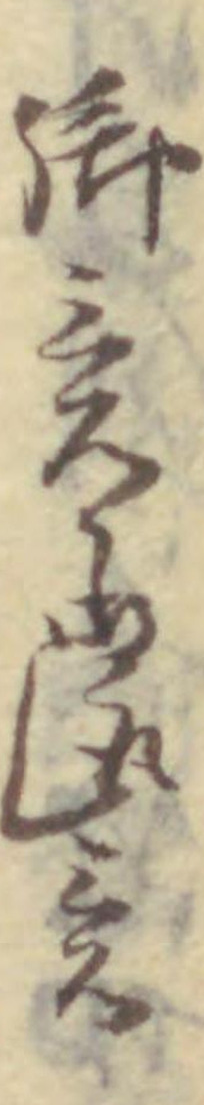御意之御趣意
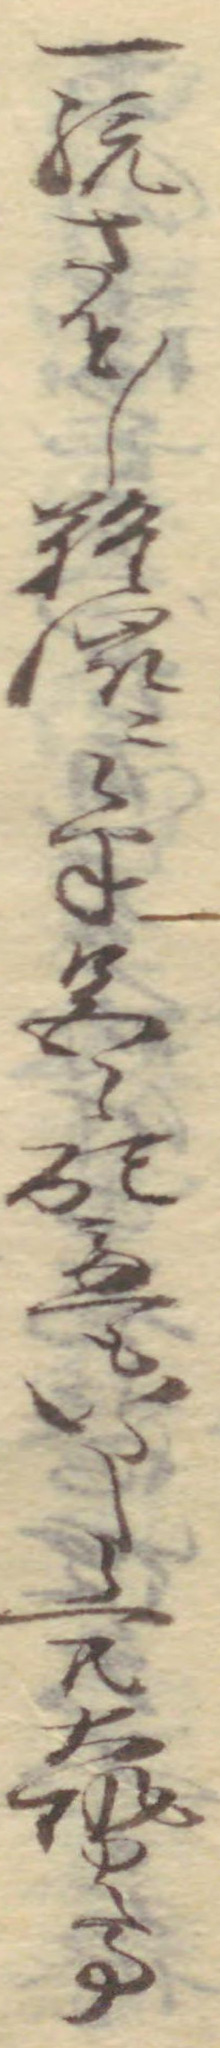一統さも〳〵難渋ニ候半色々配慮もいたし候へ共大勢之事
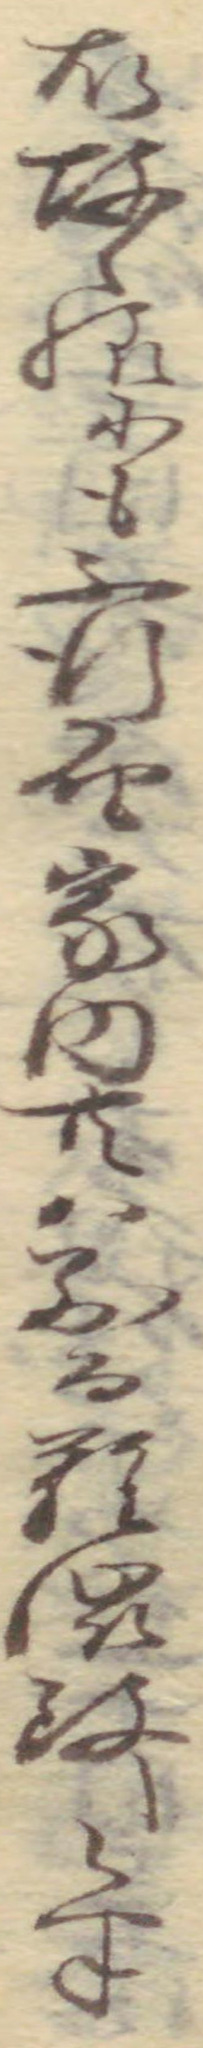故存候様にも不行届家内共ハ別而難渋致し候半
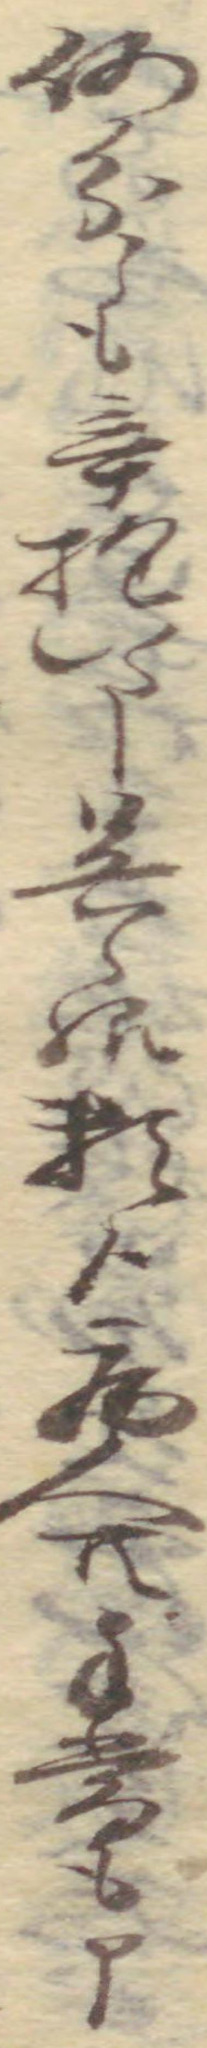何分ニも辛抱致し呉候様頼候病人共手当も申
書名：鶯宿雑記. 巻199-200
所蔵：国立国会図書館 National Diet Library, JAPAN
